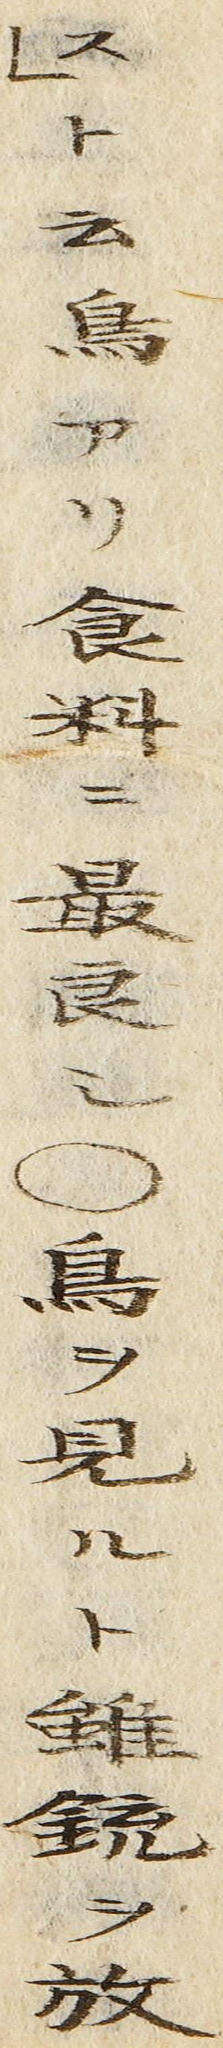ス」ト云鳥アリ食料ニ最良シ◯鳥ヲ見ルト雖銃ヲ放
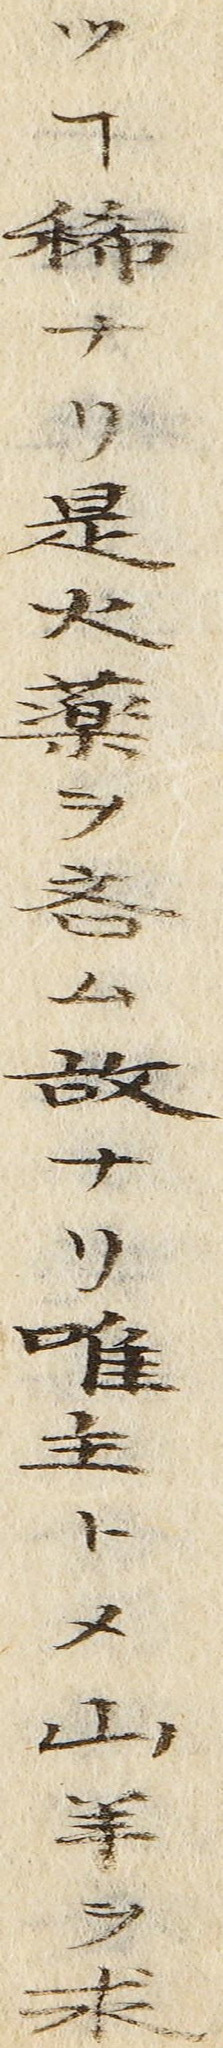ツコト稀ナリ是火薬ヲ吝ム故ナリ唯主トシテ山羊ヲ求
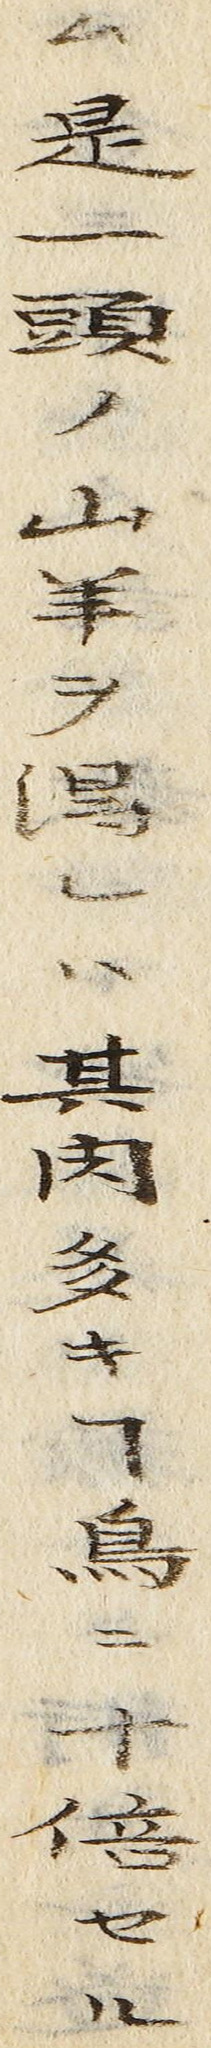ム是一頭ノ山羊ヲ得レハ其肉多キコト鳥ニ十倍セル
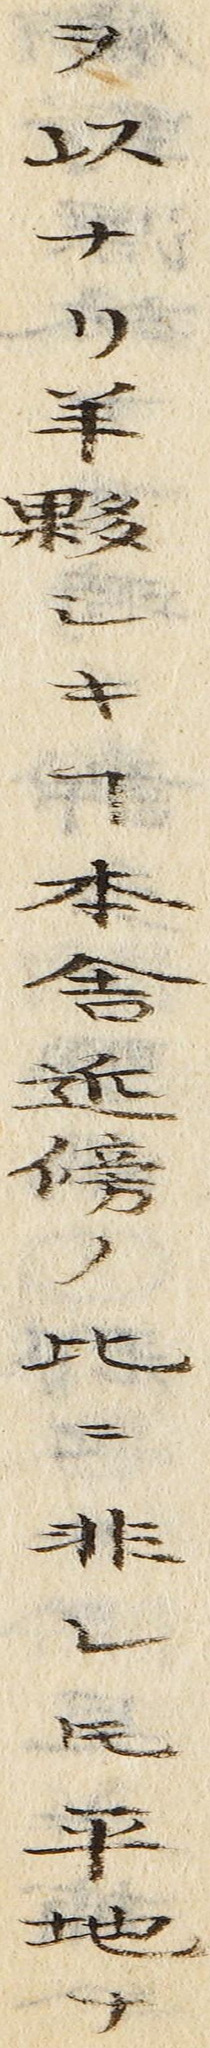ヲ以ナリ羊夥シキコト本舎近傍ノ此ニ非レトモ平地ナ
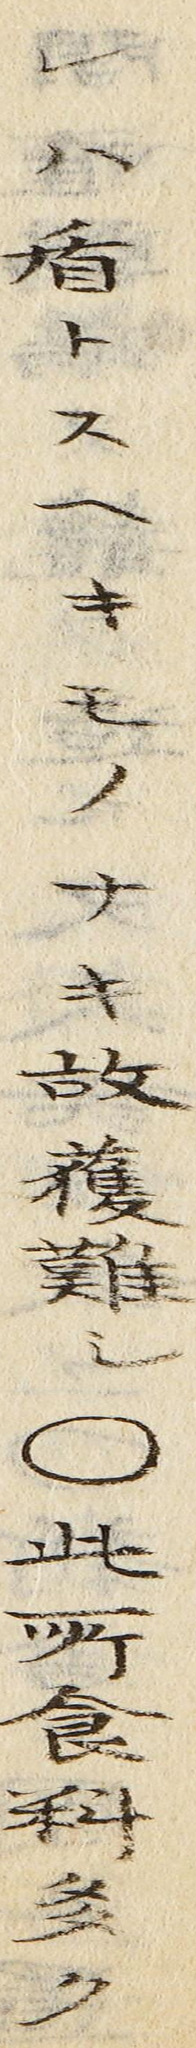レハ盾トスヘキモノナキ故獲難シ◯此所食料多ク
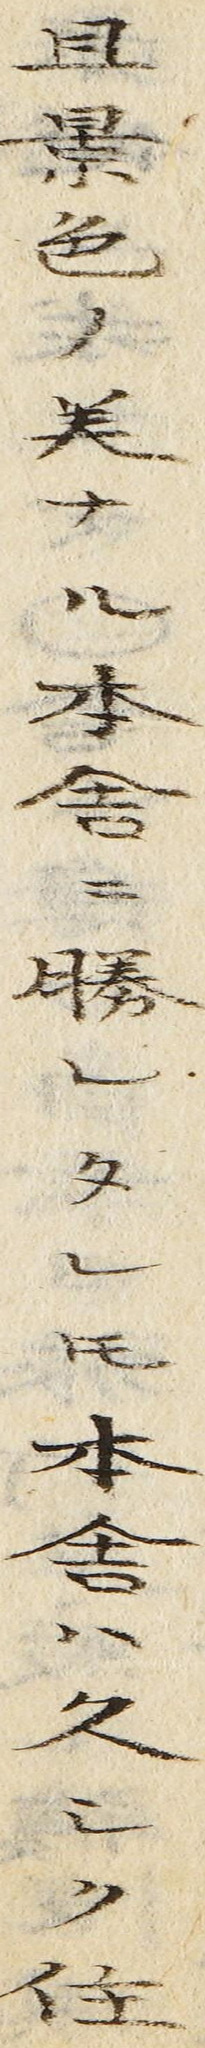且景色ノ美ナル本舎ニ勝レタレトモ本舎ハ久シク住
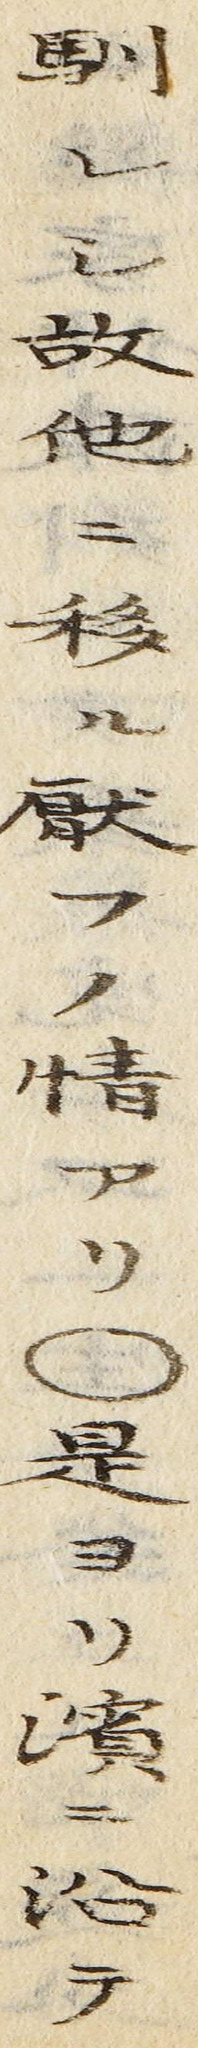馴レシ故他ニ移ル厭フノ情アリ◯是ヨリ浜ニ沿テ
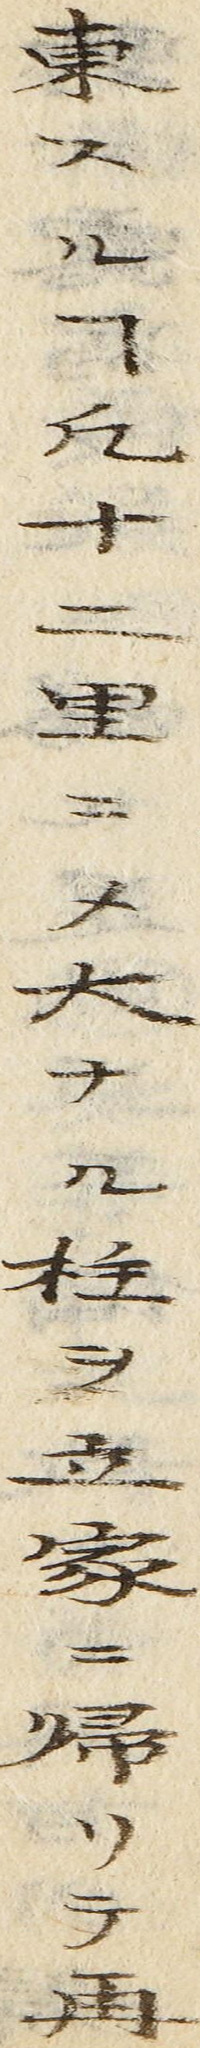東スルコト凡十二里ニシテ大ナル柱ヲ立家ニ帰リテ再
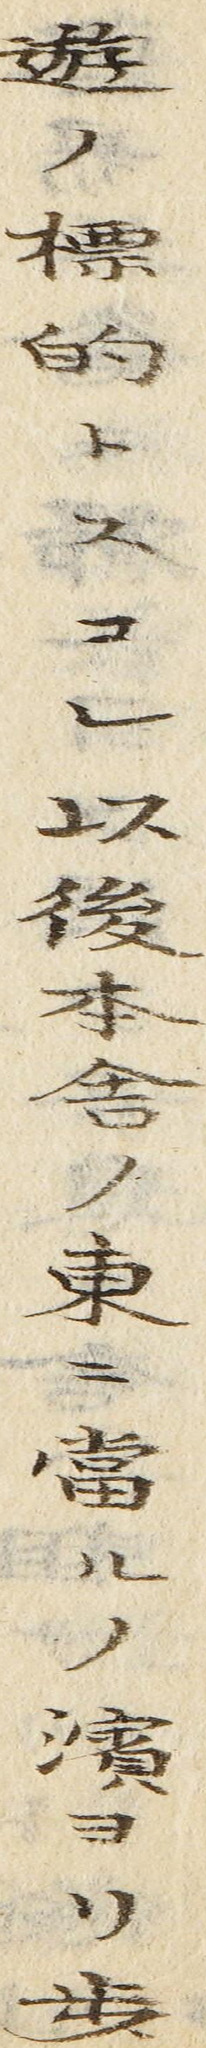遊ノ標的トスコレ以後本舎ノ東ニ当ルノ浜ヨリ歩
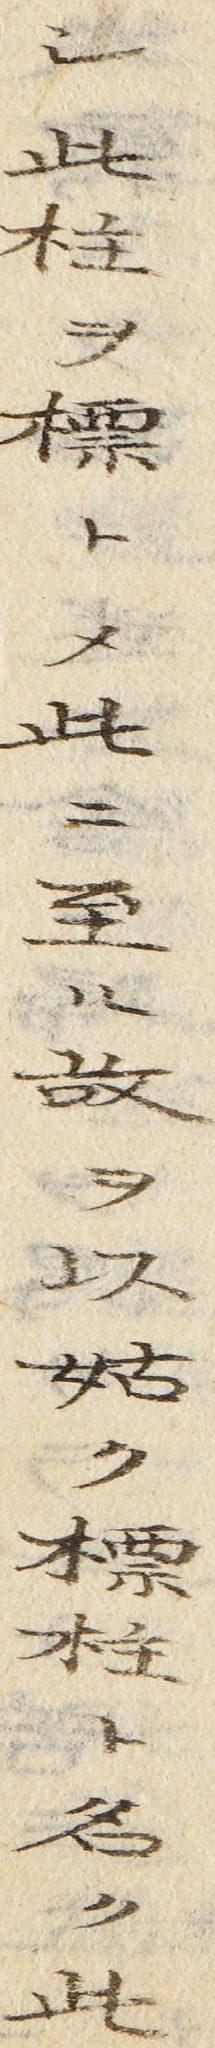シ此柱ヲ標トシテ此ニ至ル故ヲ以姑ク標柱ト名ク此
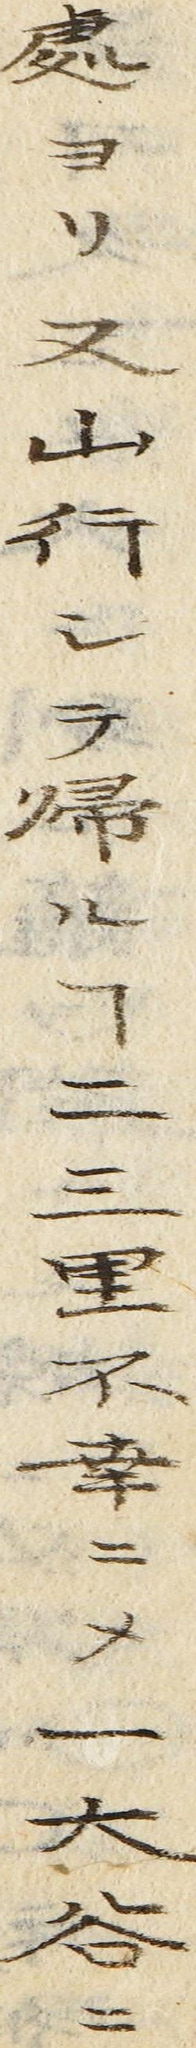処ヨリ又山行シテ帰ルコト二三里不幸ニシテ一大谷ニ
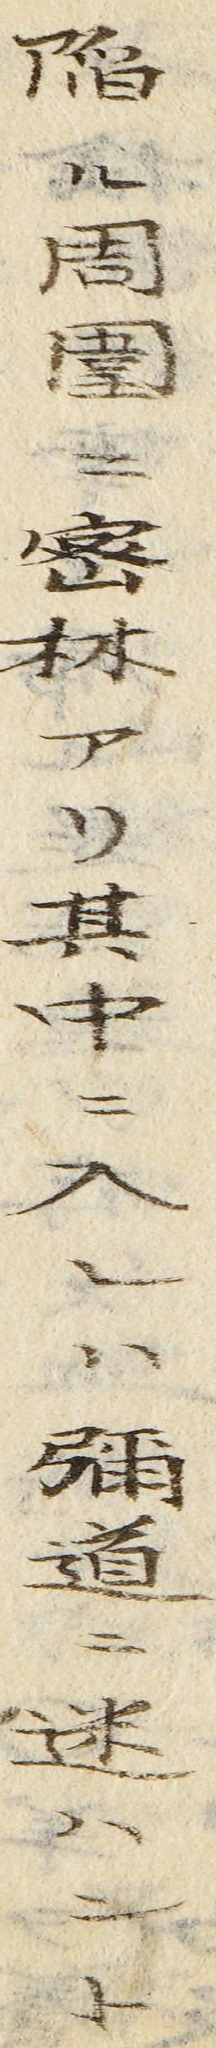陥ル周囲ニ密林アリ其中ニ入レハ弥道ニ迷ハント
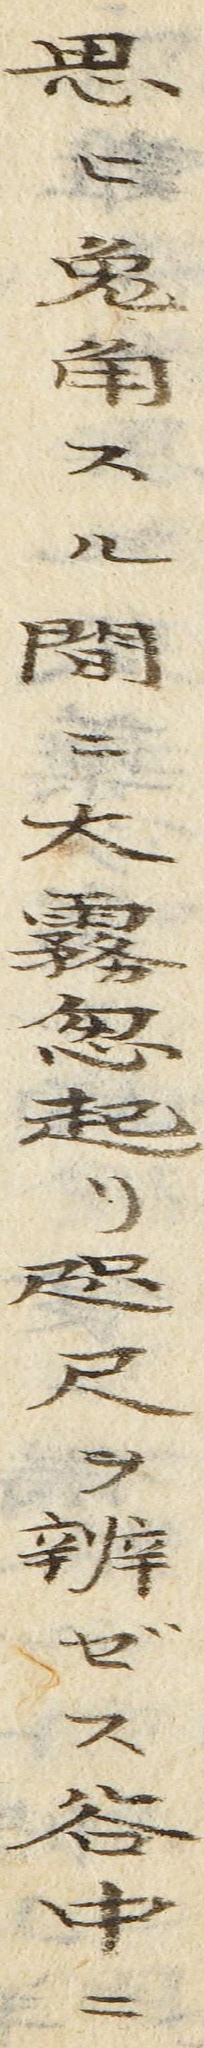思ヒ兎角スル間ニ大霧忽起リ咫尺ヲ弁ゼス谷中ニ
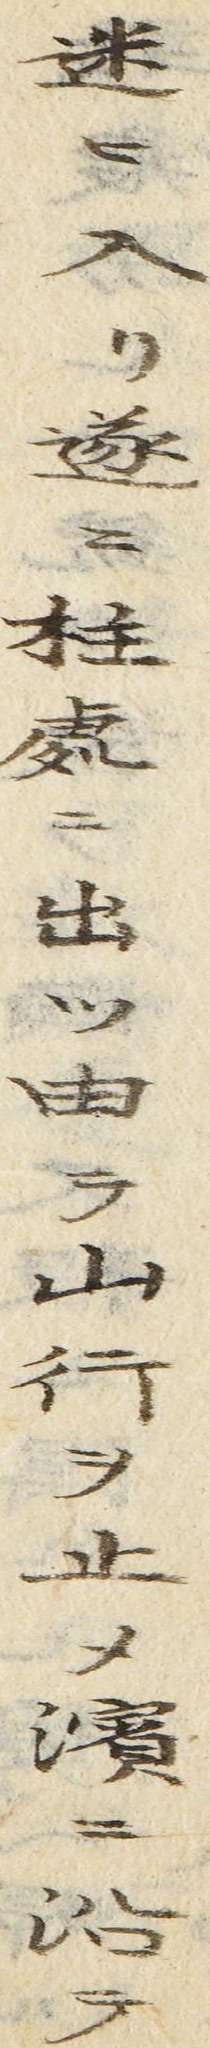迷ヒ入リ遂ニ柱処ニ出ツ由テ山行ヲ止メ浜ニ沿テ
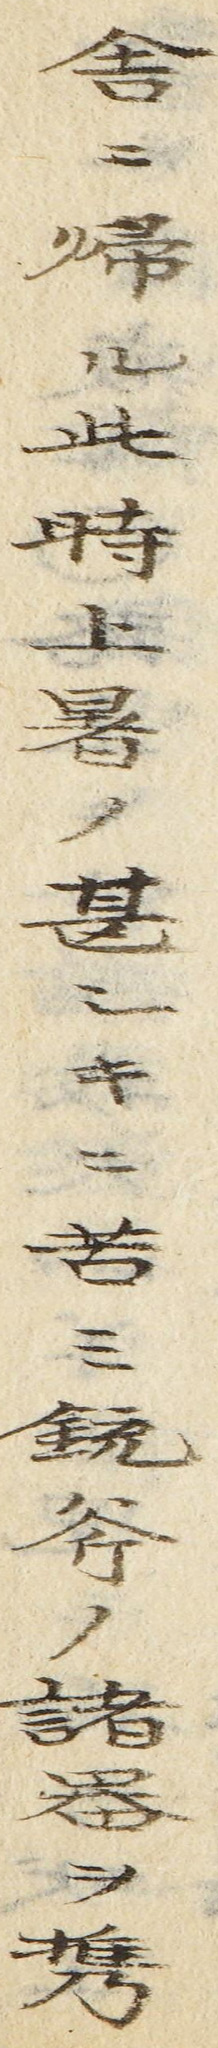舎ニ帰ル此時上暑ノ甚シキニ苦ミ銃斧ノ諸器ヲ携

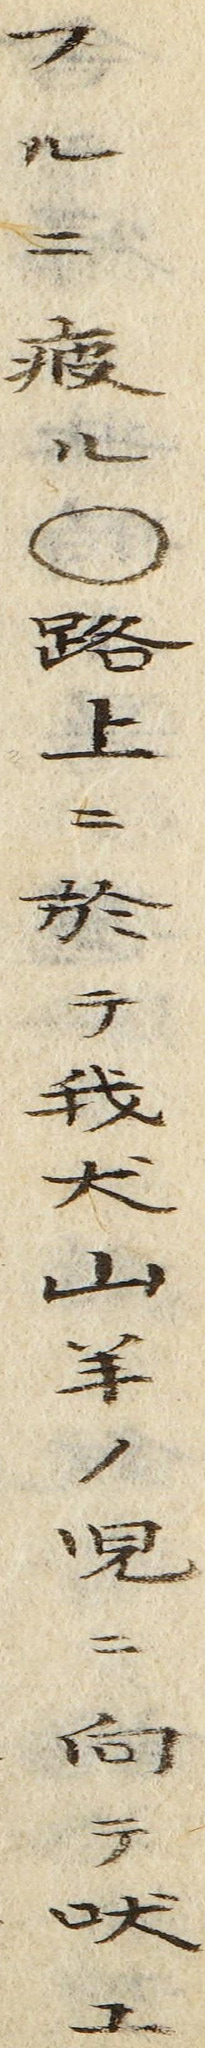フルニ疲ル◯路上ニ於テ我犬山羊ノ児ニ向テ吠ユ
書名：漂流紀事
